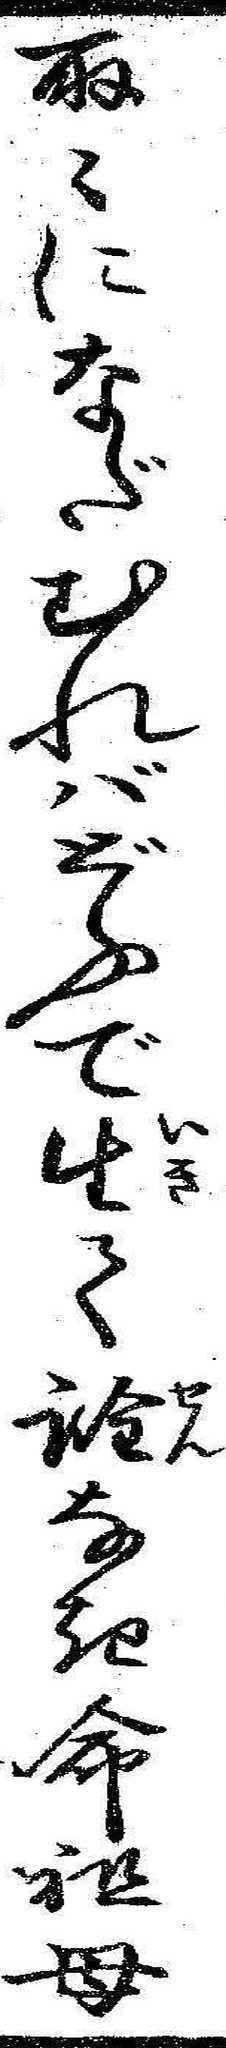取々になだむればどふで生て詮なき命祖母
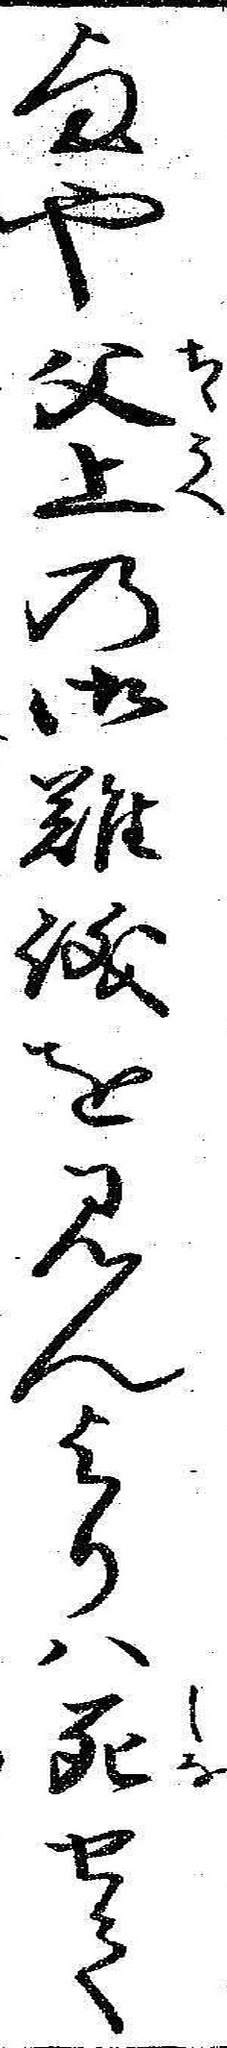様や父上の御難儀を見んよりは死せて
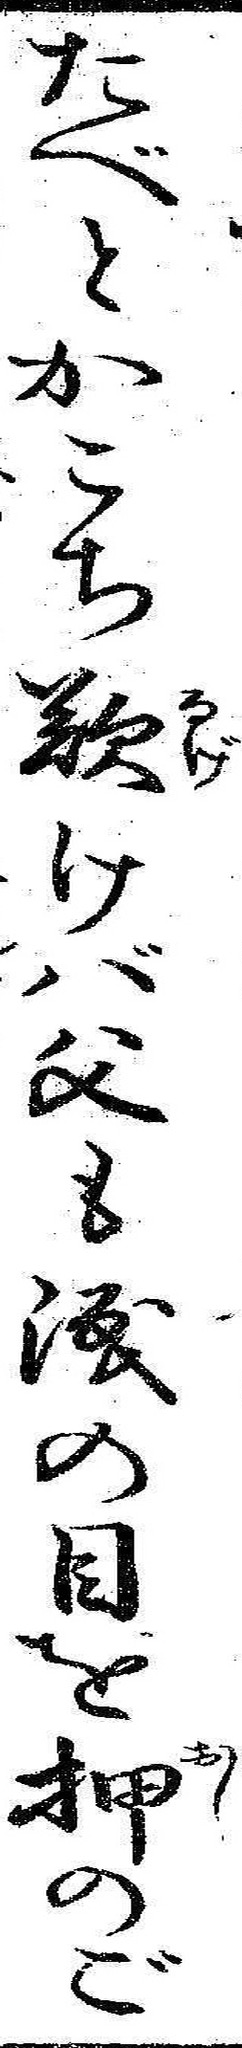たべとかこち歎けば父も涙の目を押のご
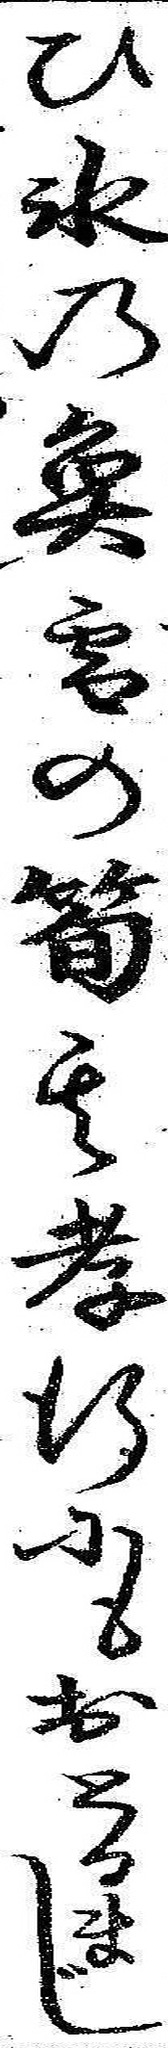ひ氷の魚雪の筍其孝行にもおとるまじ
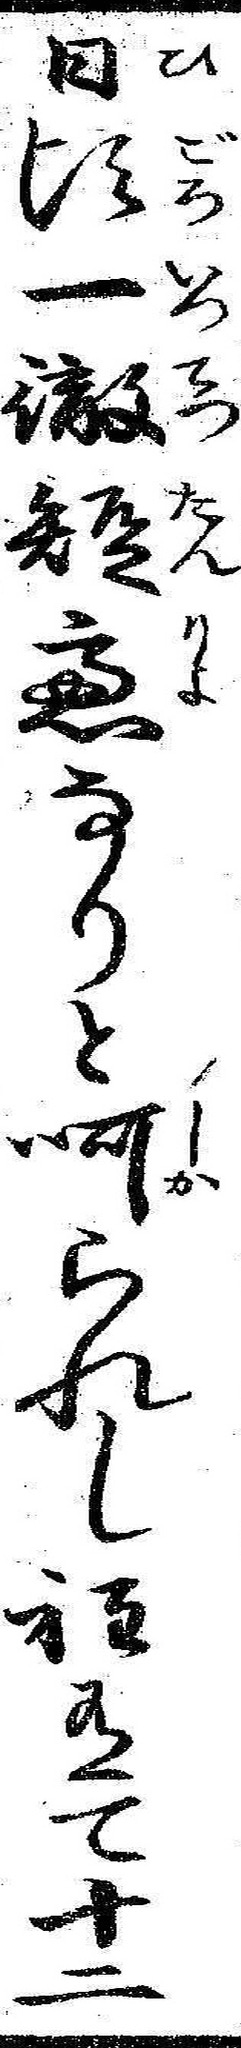日頃一徹短慮なりと呵られし程有て十二
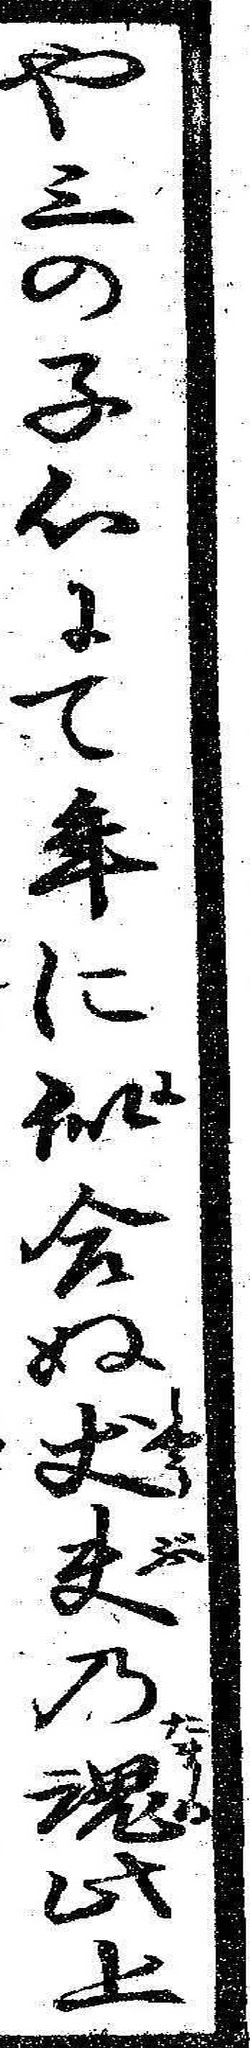や三の子心にて年に似合ぬ丈夫の魂此上
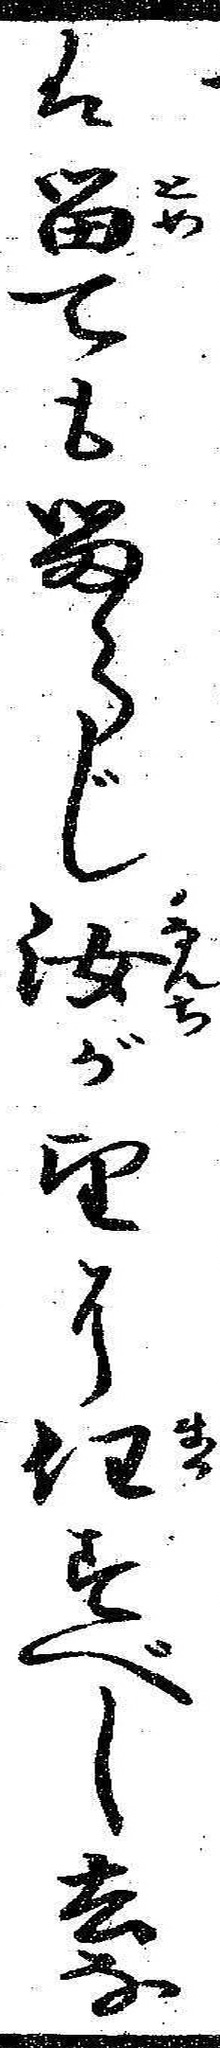は留ても留らじ汝が望に任すべし去な
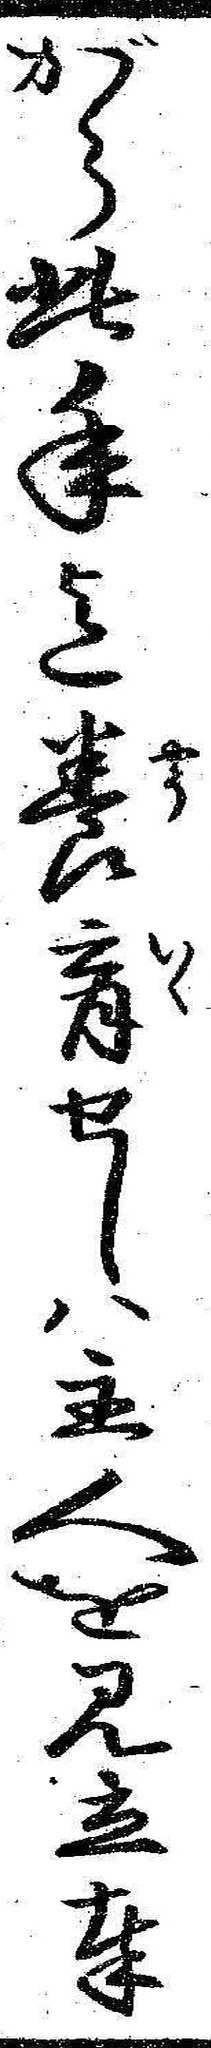がら此年迄養育せしは主人を見立奉
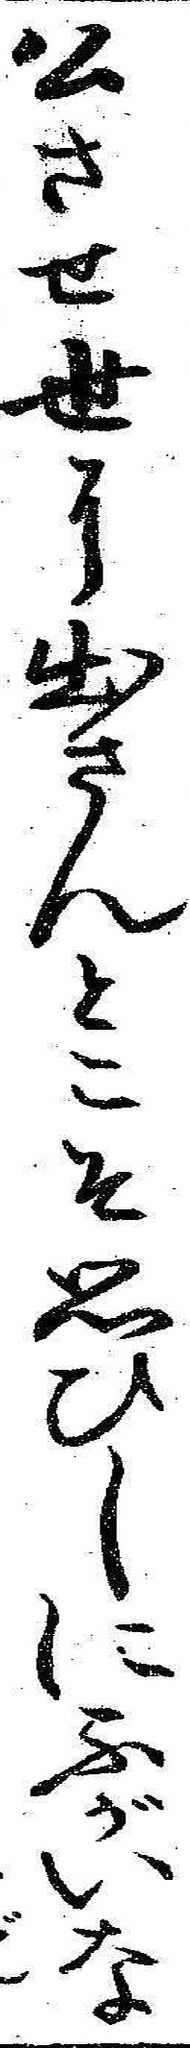公させ世に出さんとこそ思ひしにふがいな
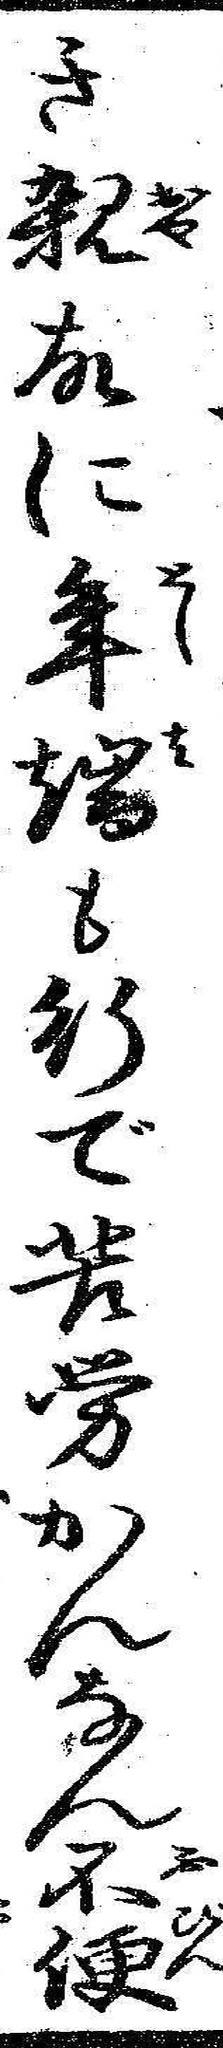き親故に年端も行で苦労かんなん不便
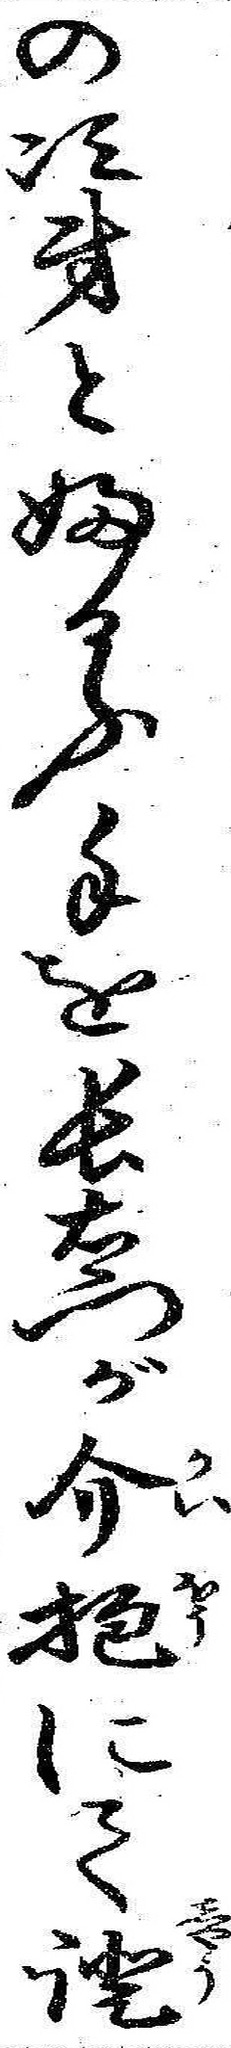の次弟とふるふ手を長右衛門が介抱にて証
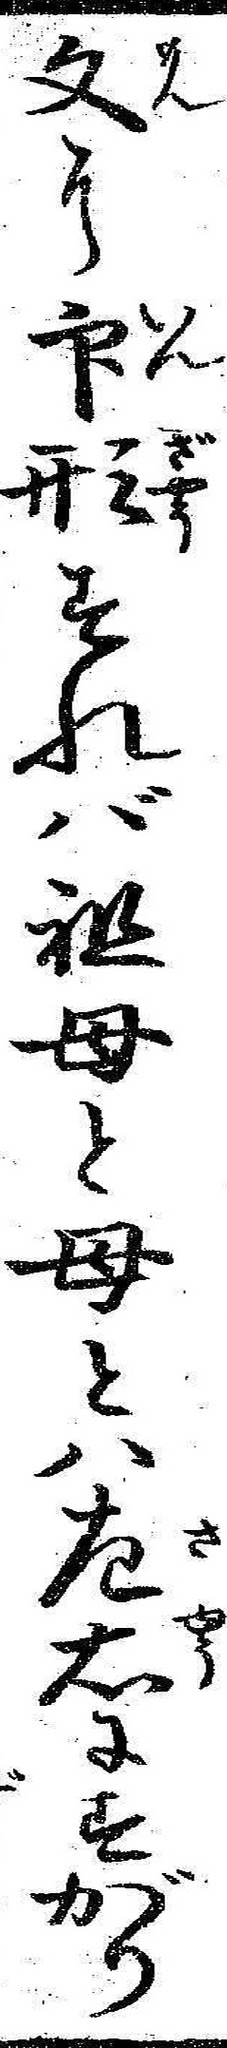文に印形すれば祖母と母とは左右にすがり
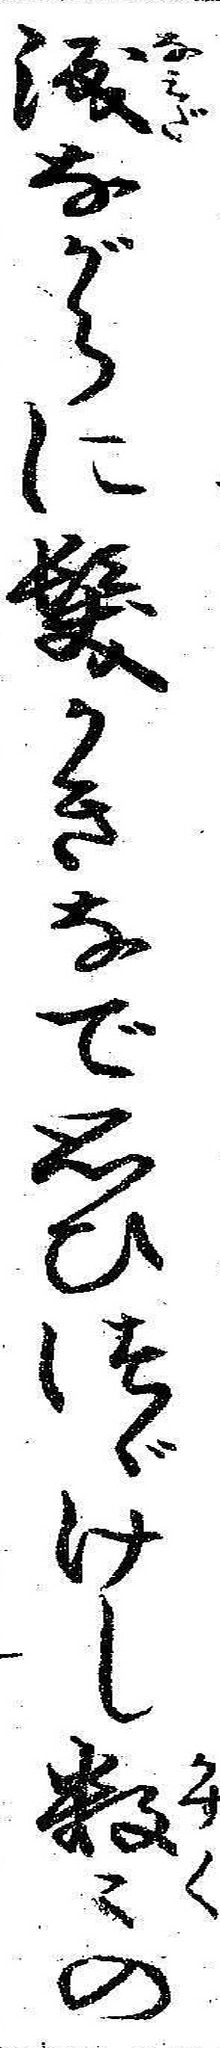涙ながらに髪かきなで思ひつゞけし数々の
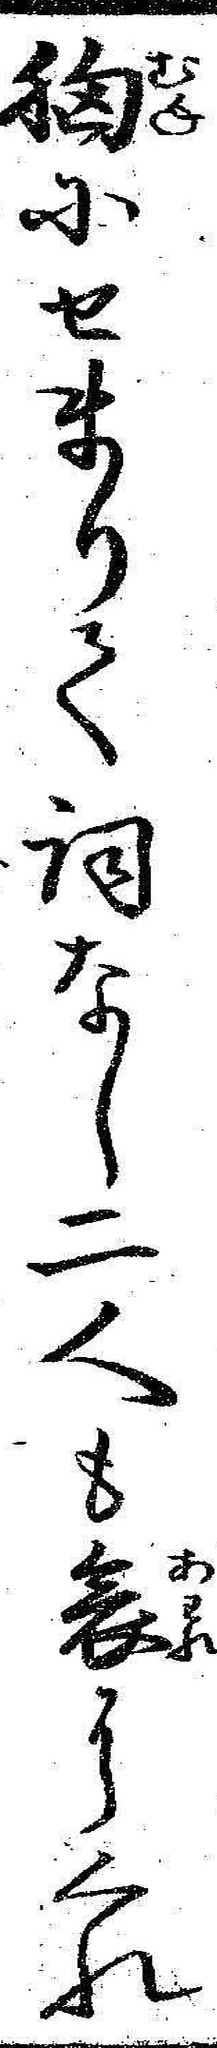胸にせまりて詞なし二人も哀にくれ
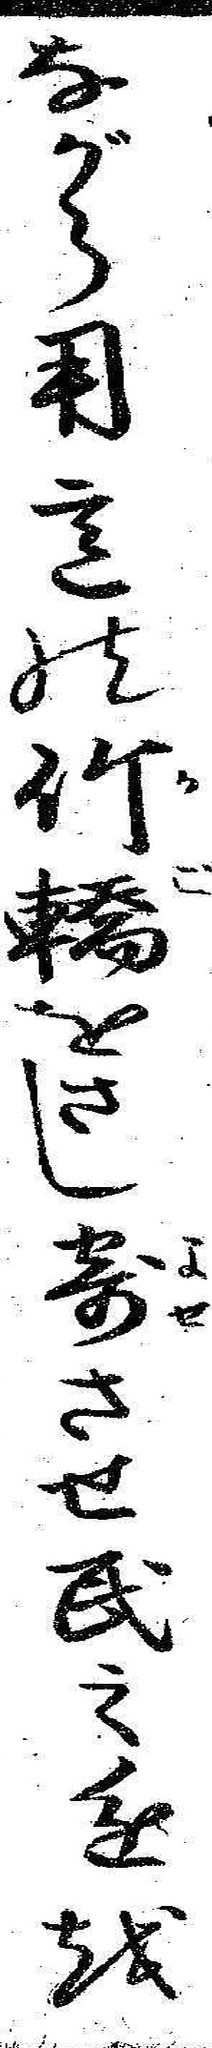ながら用意の竹轎をさし寄させ民之進を

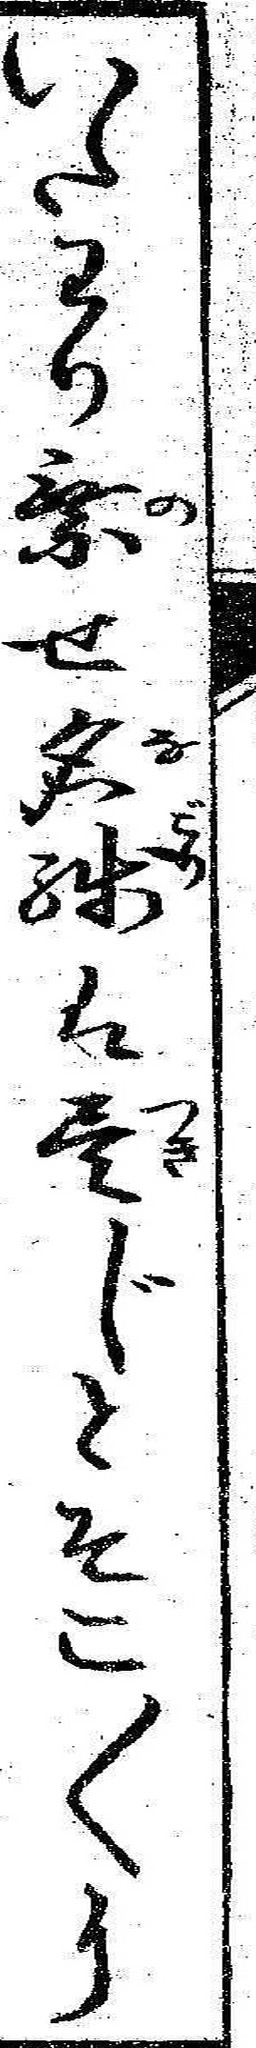いたわり乗せ名残は尽じとそこ〱に
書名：根無草後編
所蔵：国文学研究資料館
